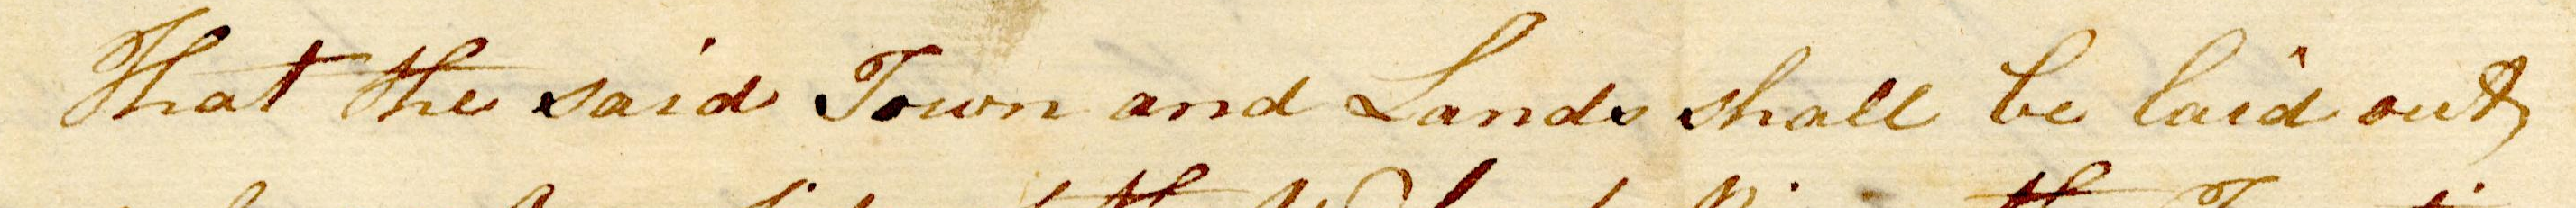That the said Town and Lands shall be laid out,
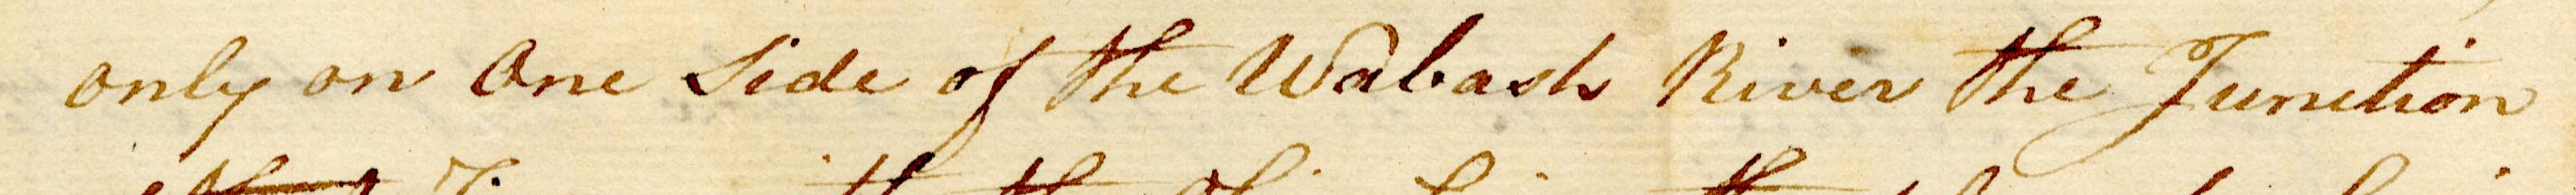only on one side of the Wabash River the Junction
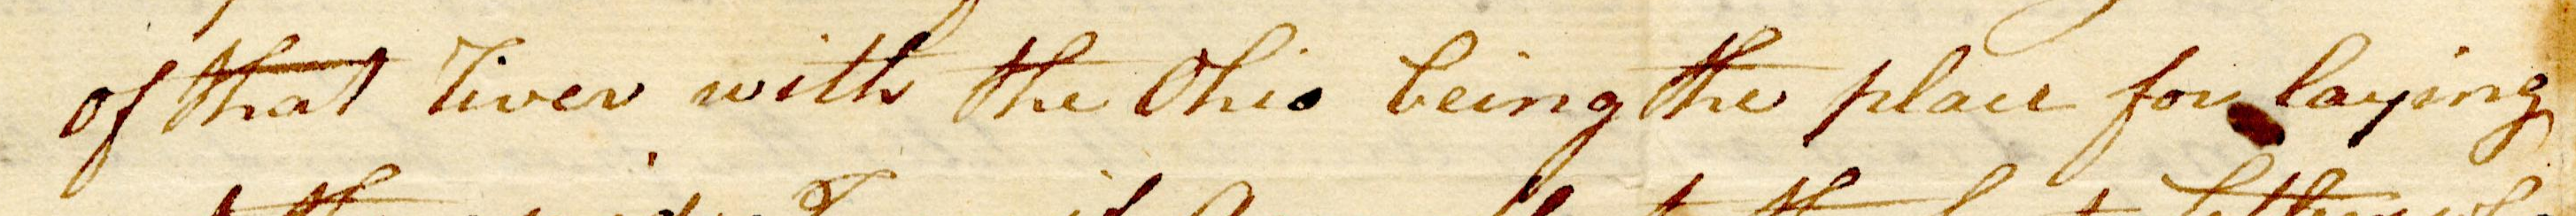of that river with the Ohio being the place for laying
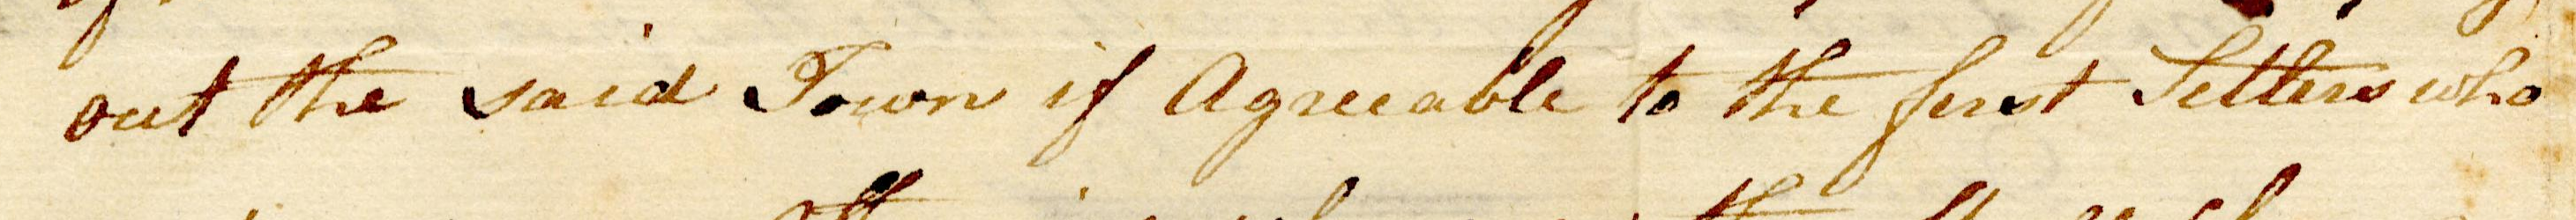out the said Town if agreeable to the first setlers who
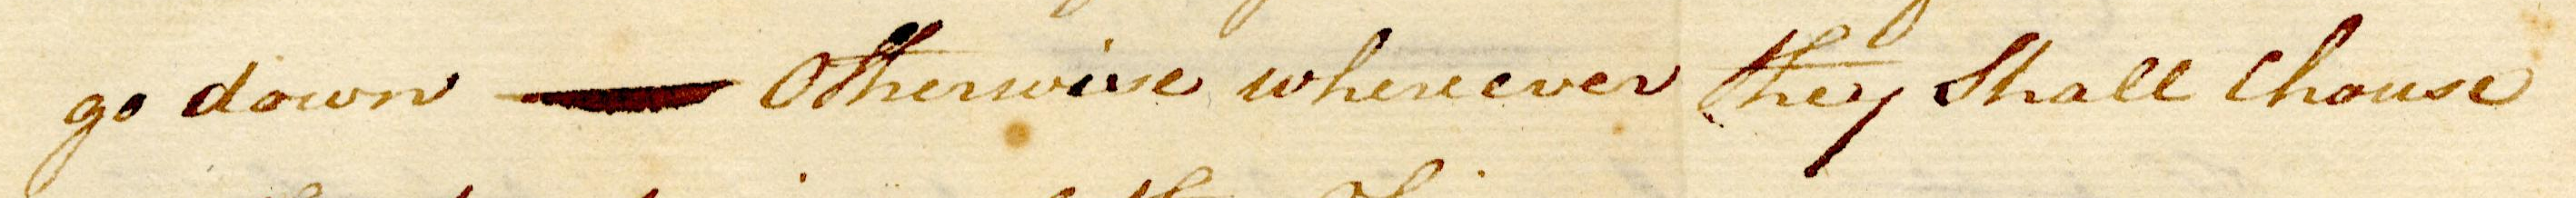go down- Otherwise whereever they Shall Chouse
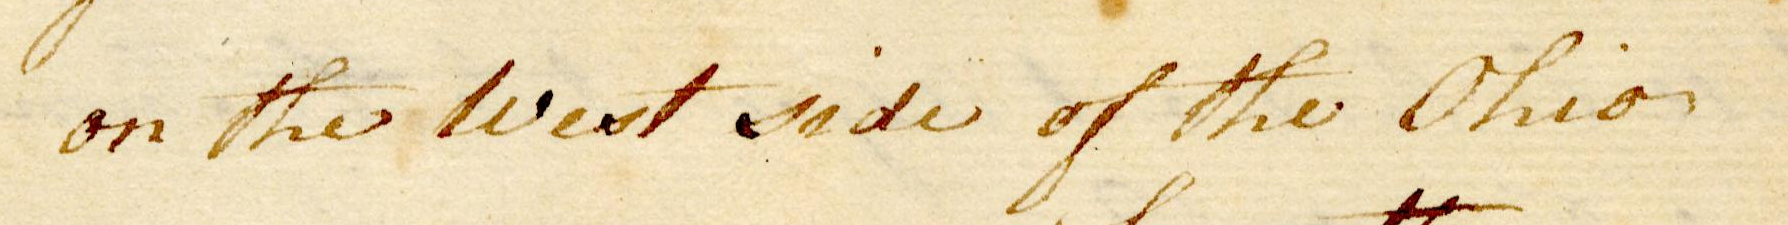on the West side of the Ohio
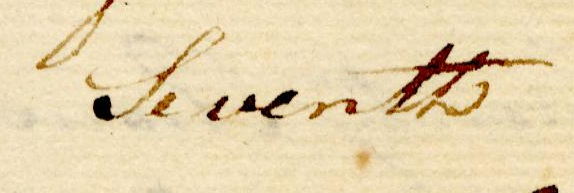Seventh
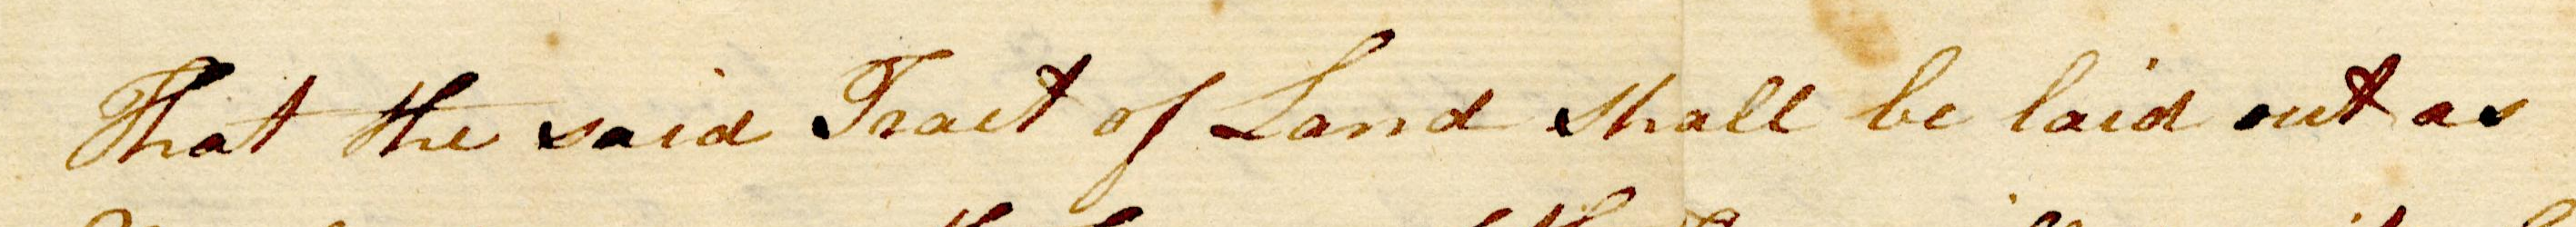That the said Tract of Land shall be laid out as
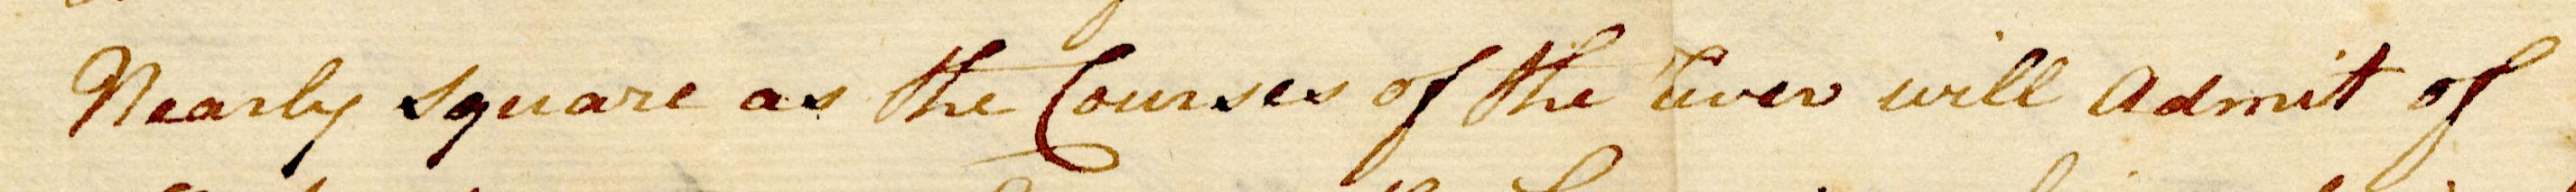Nearly square as the Courses of the river will Admit of
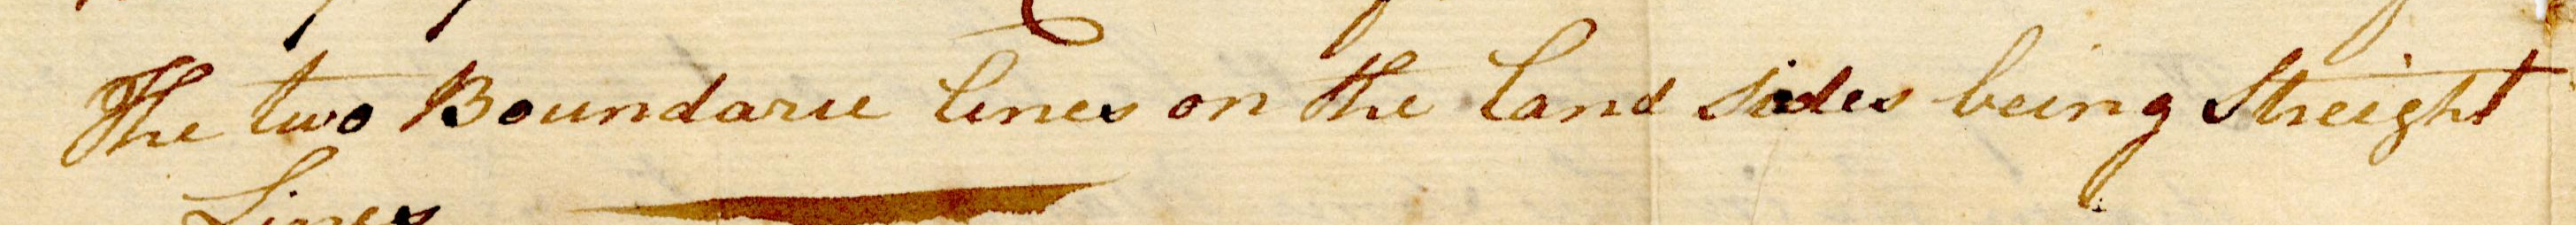The two Boundaree lines on the land sides being Streight
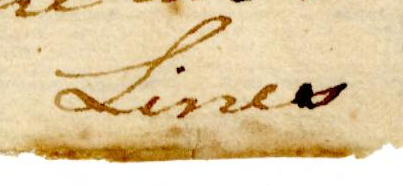Lines
